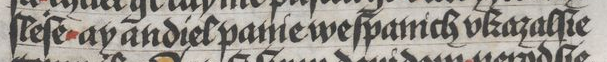ſleẛe.ay andíel panie weſpanich ukazal ſie
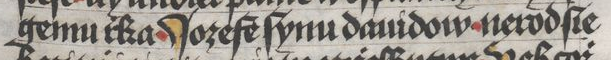gemu ṙka.Iozeſe ſynu dauidow.nerod ſie
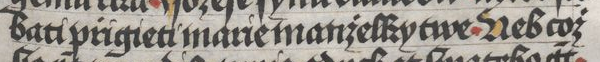bati pṙigieti marie manżelky twe.Neb což
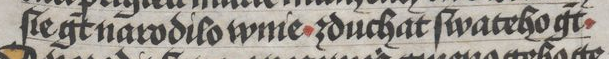ſie ḡt narodilo wnie.zduchat ſwateho ḡt.
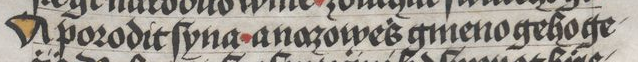A porodit ſyna.a nazoweṡ gmeno geho ge¬
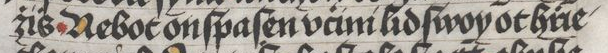żíṡ.Nebot on ſpaſen vċíní lid ſwoy ot hṙie¬
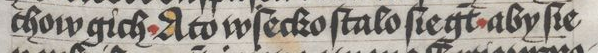chow gich.A to wẛecko ſtalo ſie ḡt.aby ſie
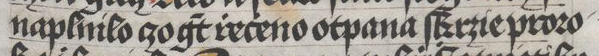naplnilo czo ḡt ṙeċeno otpana ſkrzie proro¬
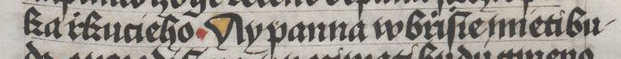ka ṙkucíeho.Ay panna wbṙiẛie míeti bu¬
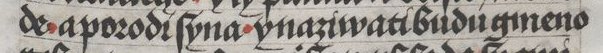de.a porodí ſyna.y naziwati budú gmeno
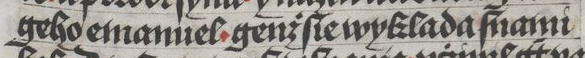geho emanuel.genż ſie wyklada ſnami
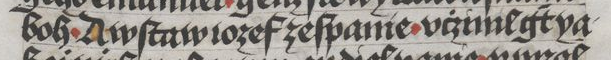boh.A wſtaw iozef zeſpaníe.vċzinil ḡt ya¬
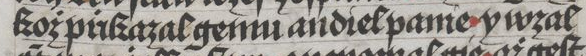koż pṙikazal gemu andiel panie.y wzal
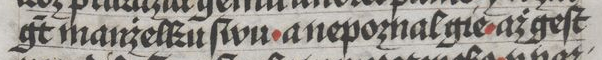ḡt manżelku ſwu.a nepoznal gíe.aż geſt
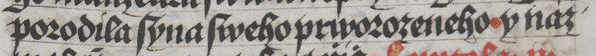porodila ſyna ſweho prworozeneho.y naz¬
